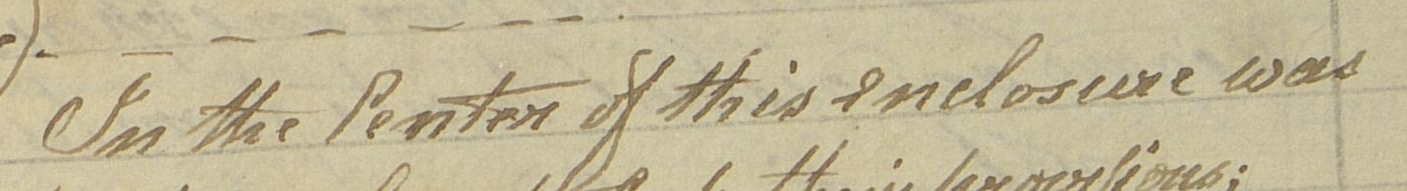In the Center of this enclosure was
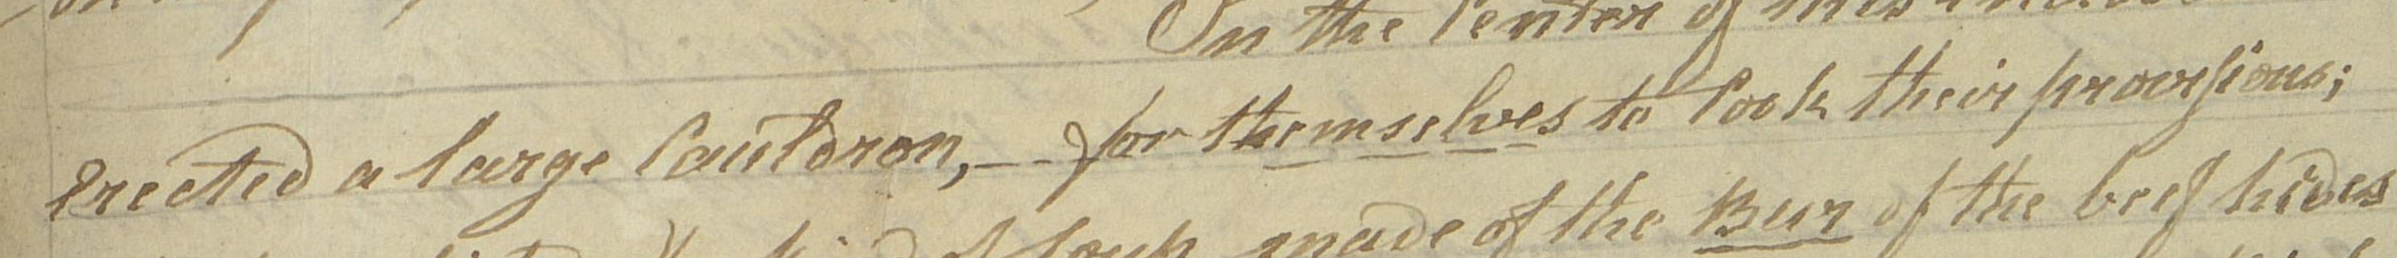erected a large Cauldron, for themselves to cook their provisions;
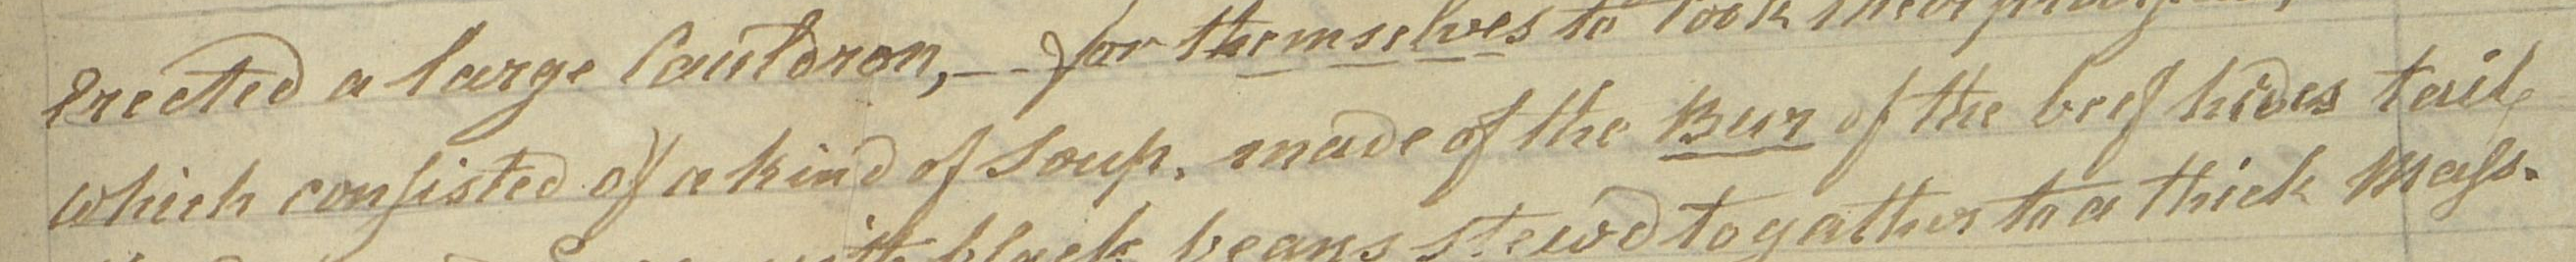which consisted of a kind of soup, made of the Bur of the beef hides tail
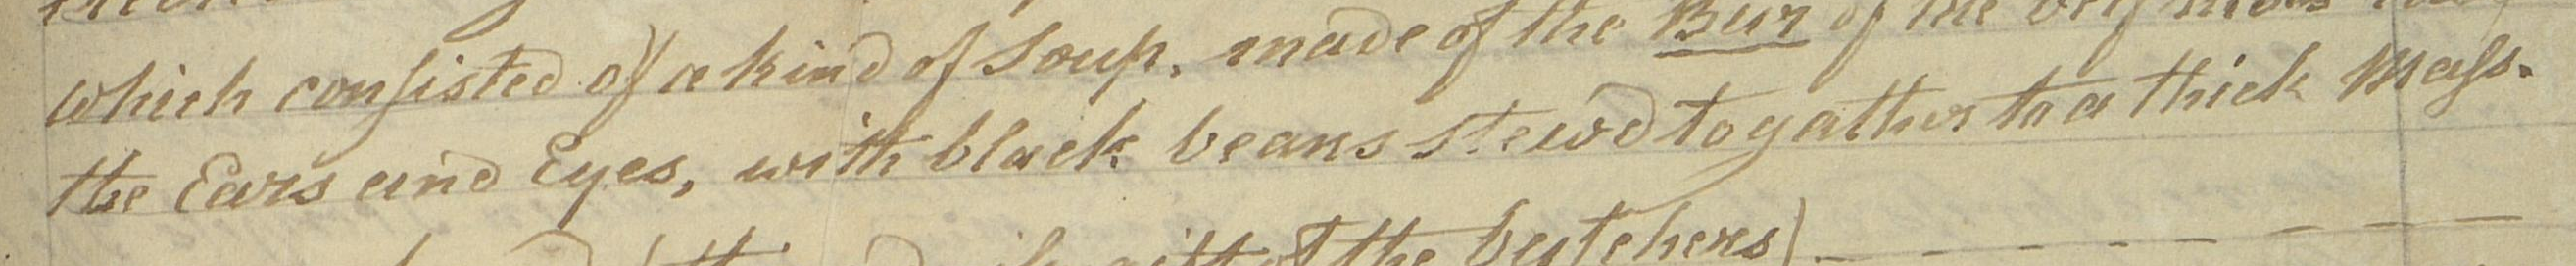the Ears and Eyes, with black beans stewd to gather to a thick Mass.
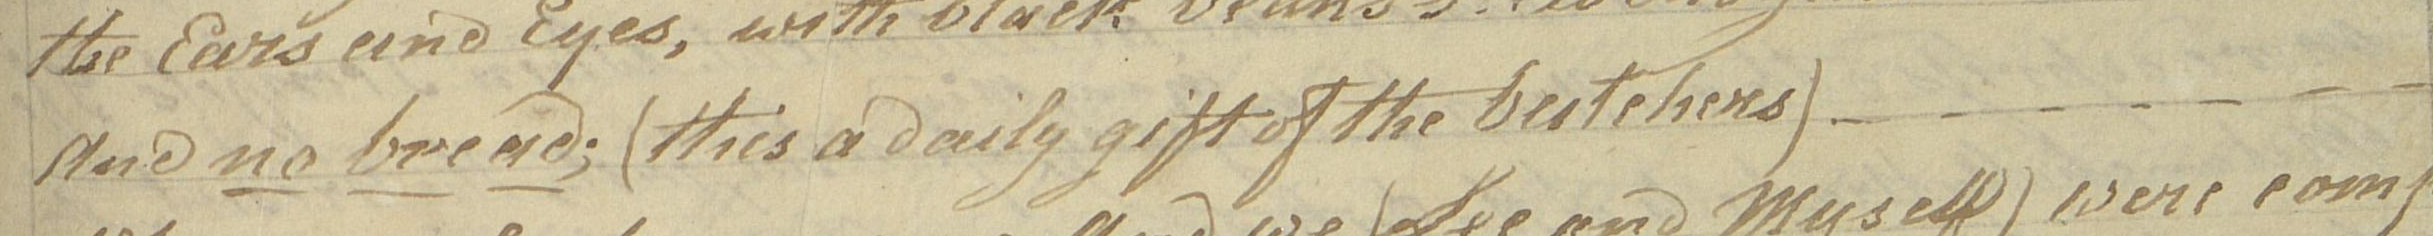And no bread; (this a daily gift of the butchers)
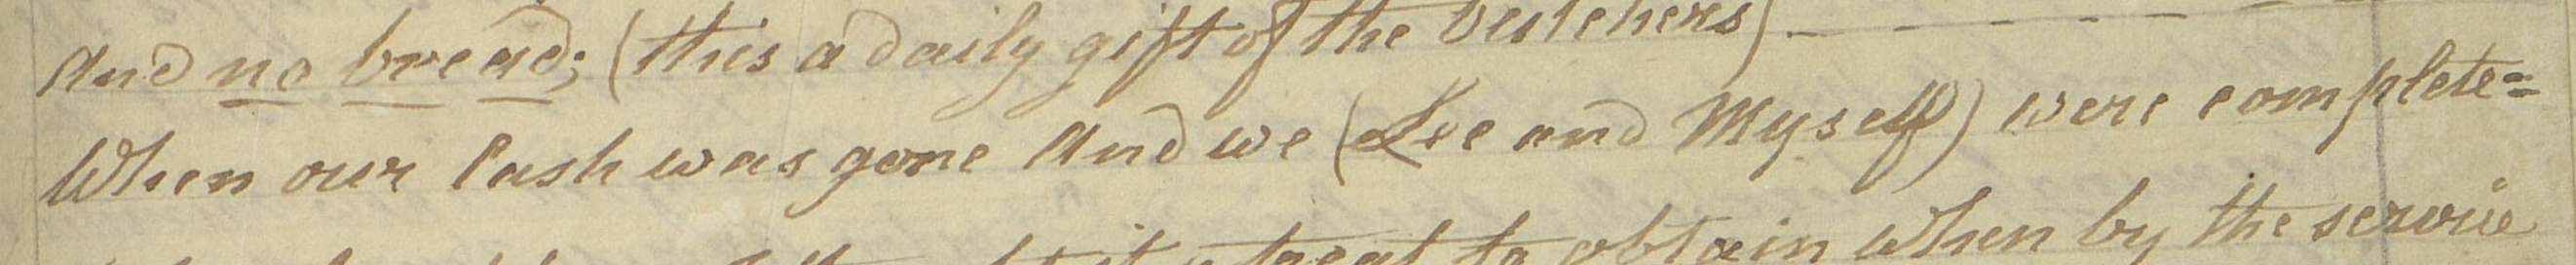When our Cash was gone and we (Lee and Myself) were complete-
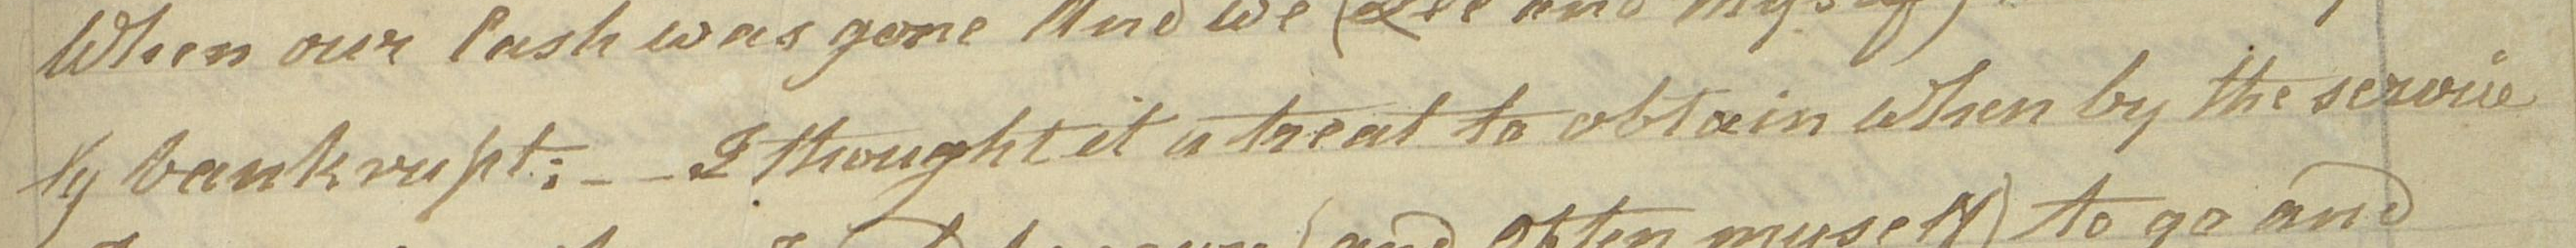by bankrupt; I thought it is treat to obtain when by the service
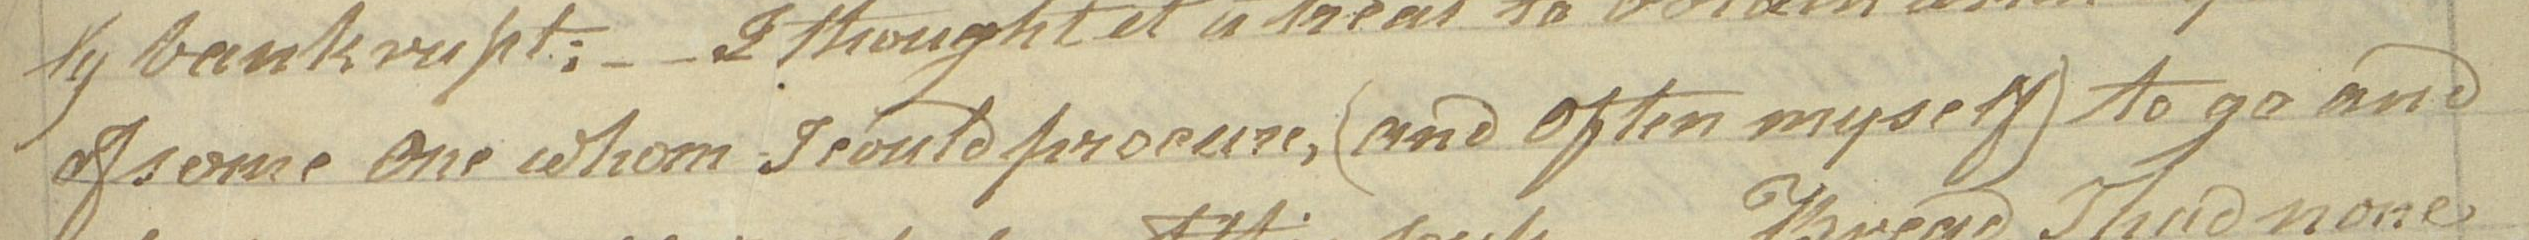of some one whom I could procure, (and Often myself) to go and
